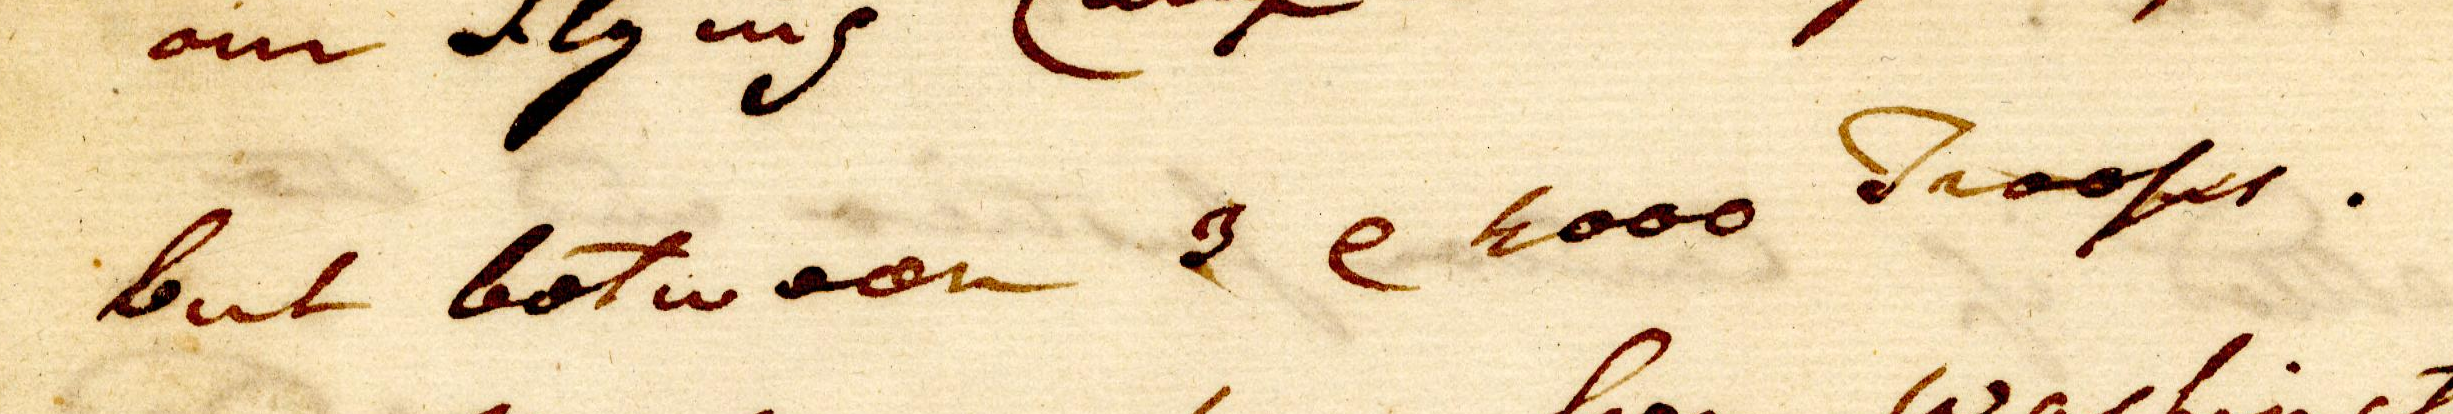but between 3 & 4000 troops.
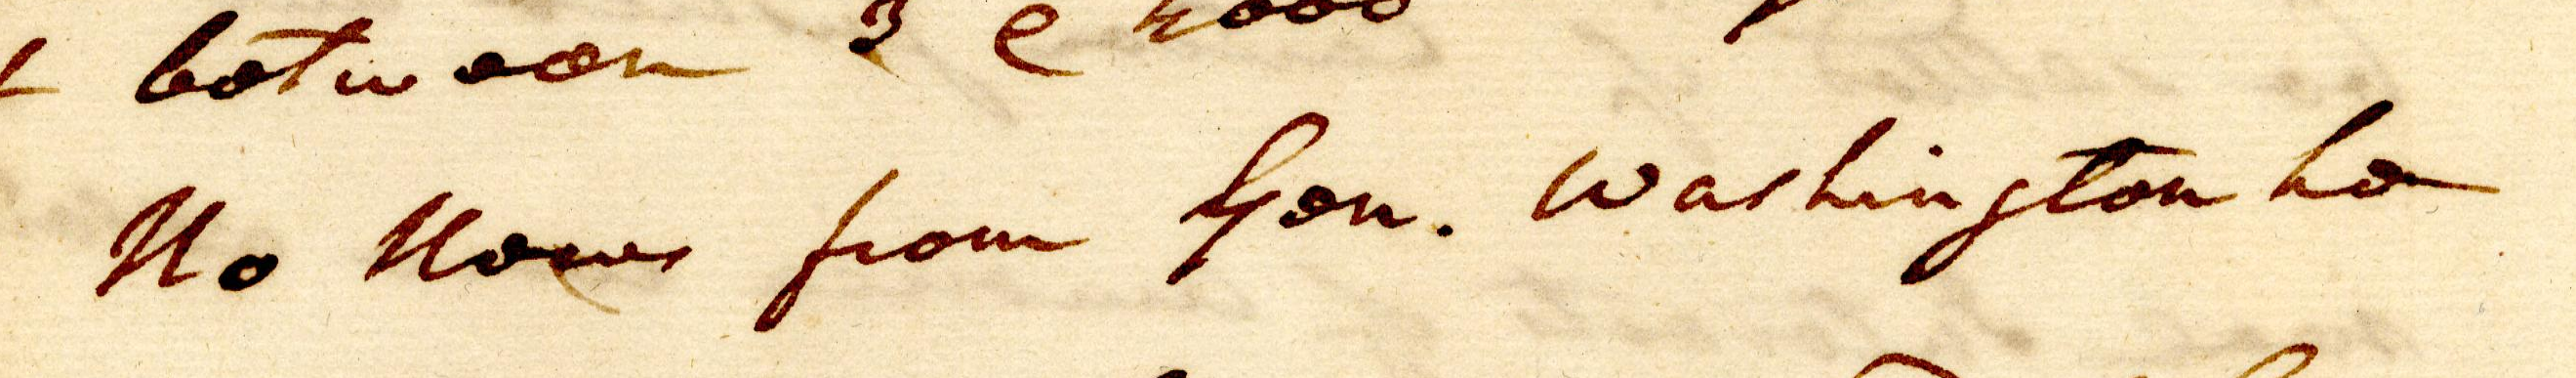No news from Gen. Washington he
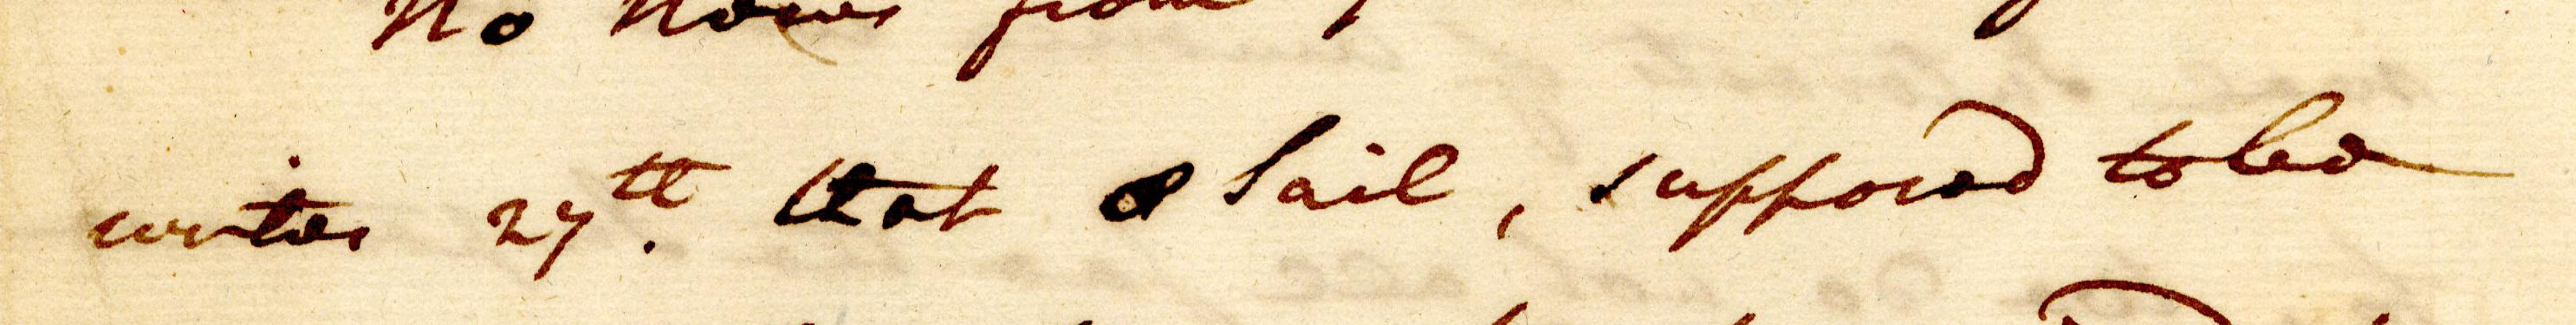writes 27^th that a sail, supposd to be
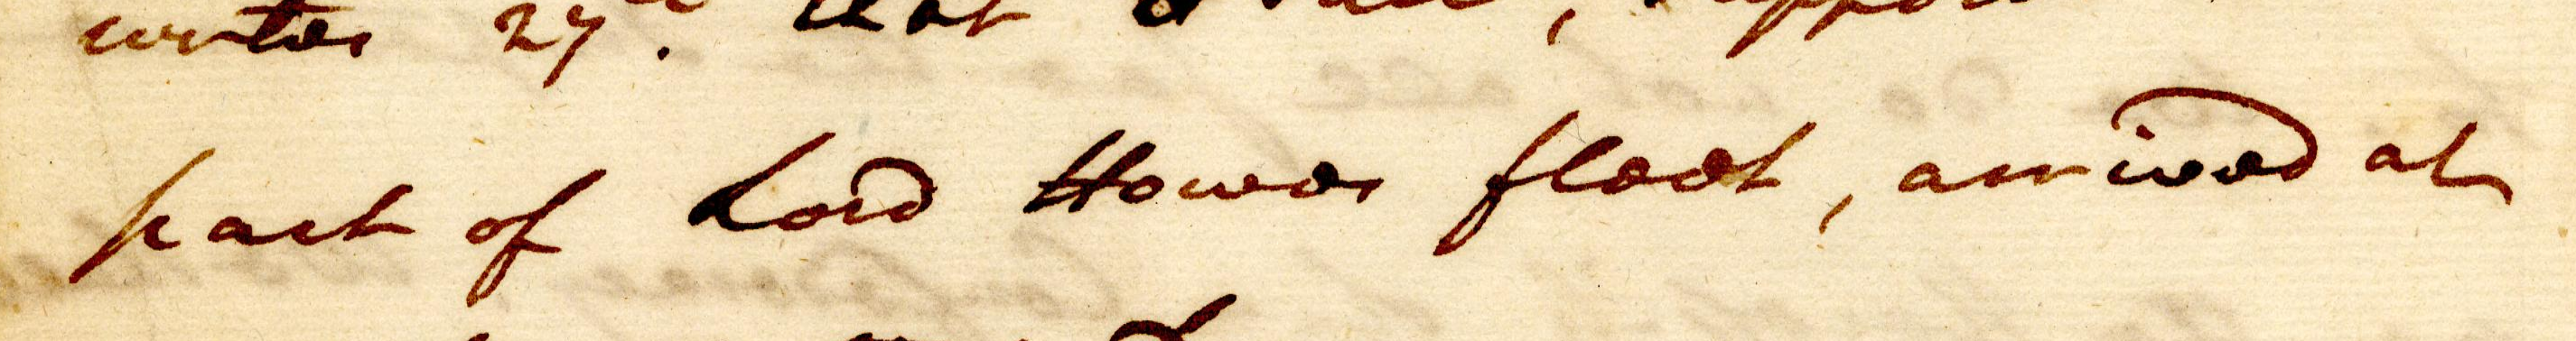part of Lord Howes fleet, arrived at
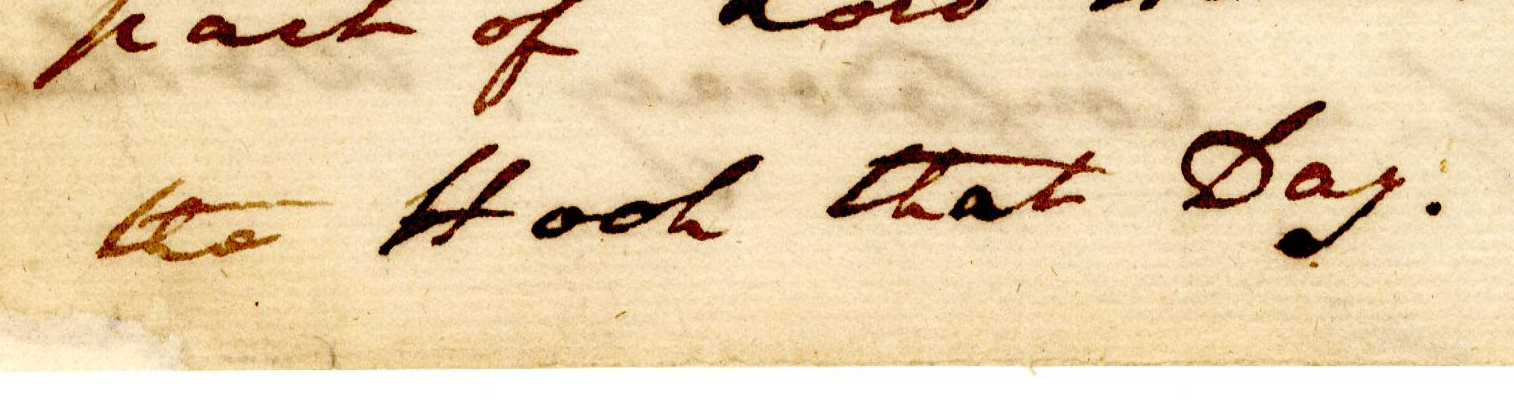us Hook that Day.
